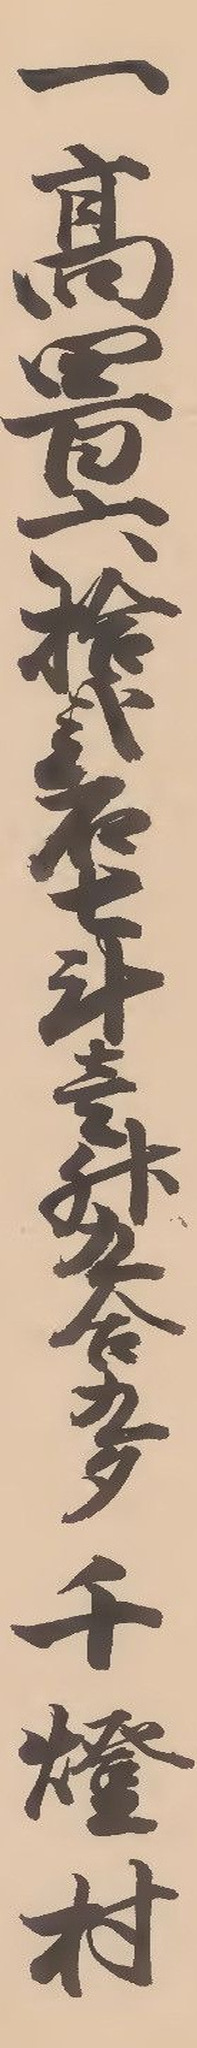一高四百六拾弐石七斗壱升九合九勺千灯村
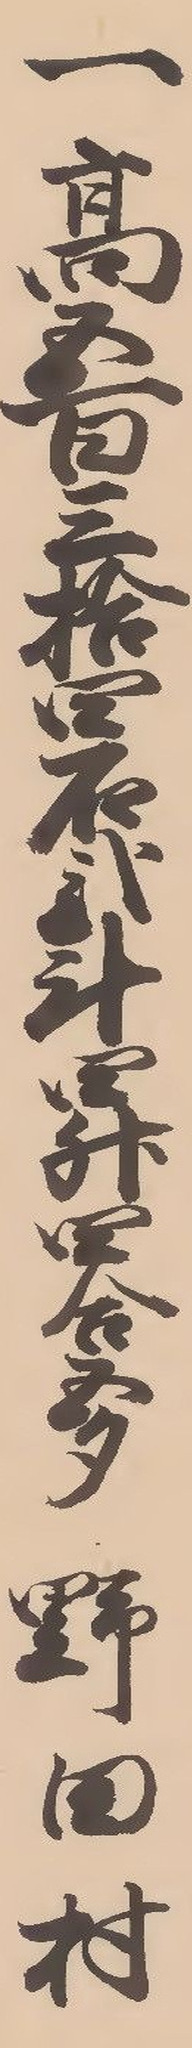一高五百三拾四石弐斗四升四合五勺野田村
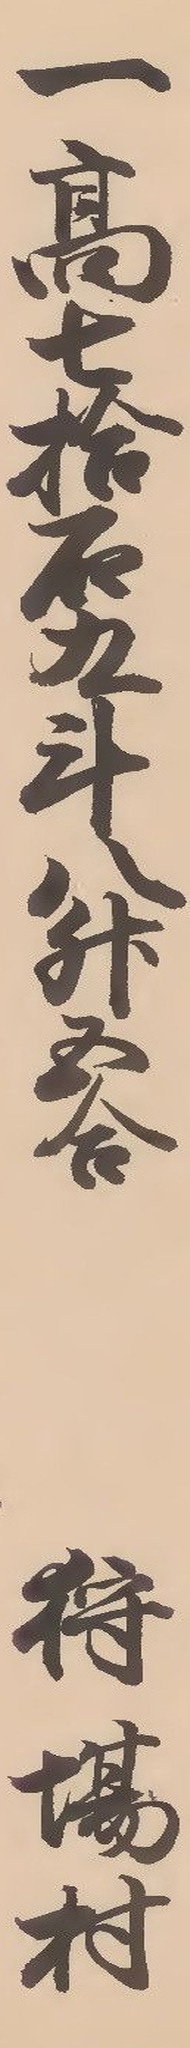一高七拾石九斗八升五合狩場村
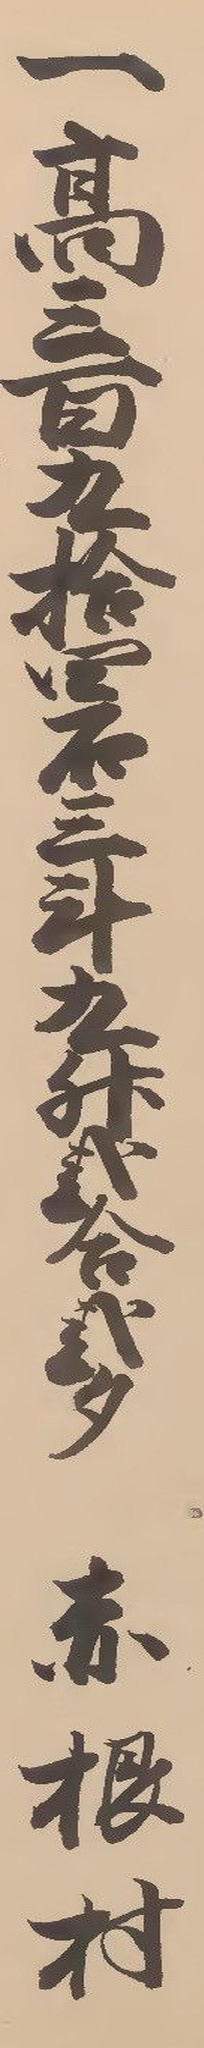一高三百九拾四石三斗九升弐合弐勺赤根村
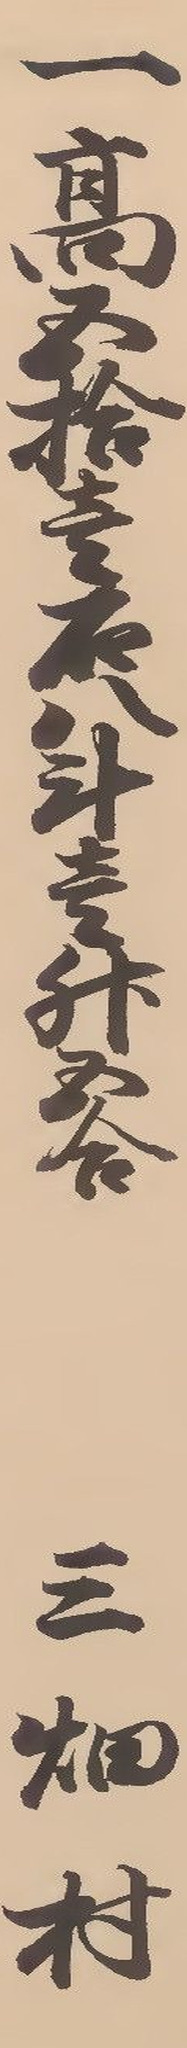一高五拾壱石八斗壱升五合三畑村
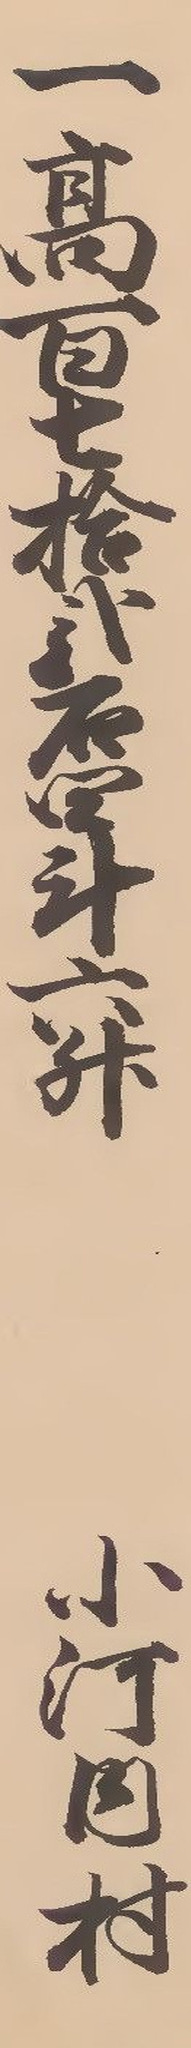一高百七拾弐石四斗六升小河内村
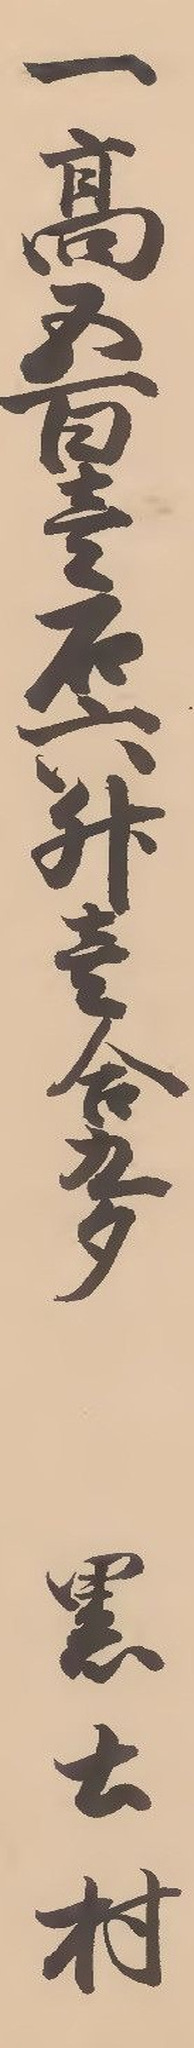一高五百壱石六升壱合九勺黒土村

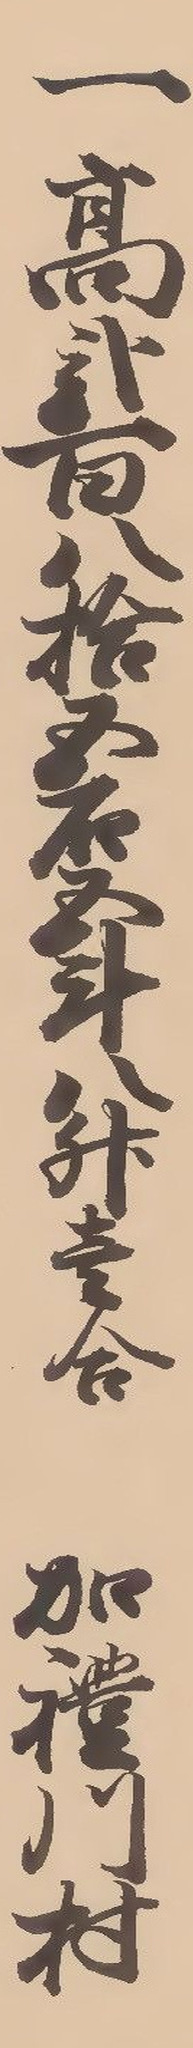一高弐百八拾五石五斗八升壱合加礼川村
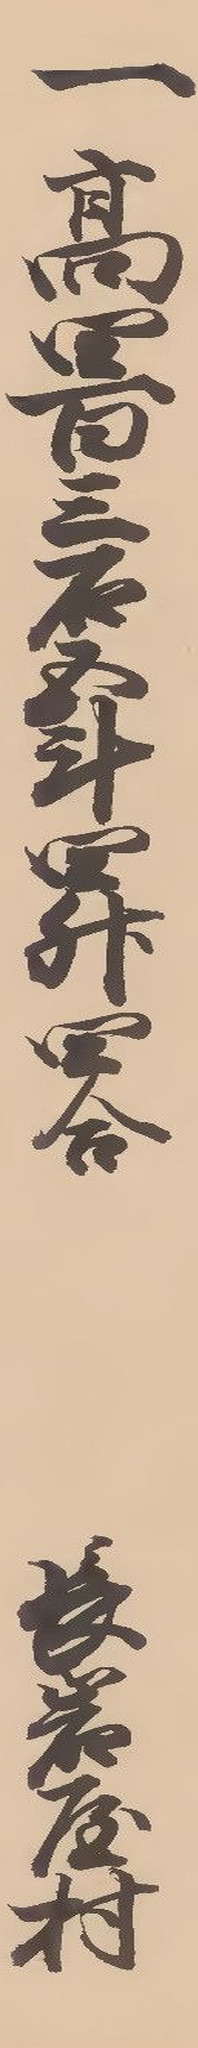一高四百三石五斗四升四合長岩屋村
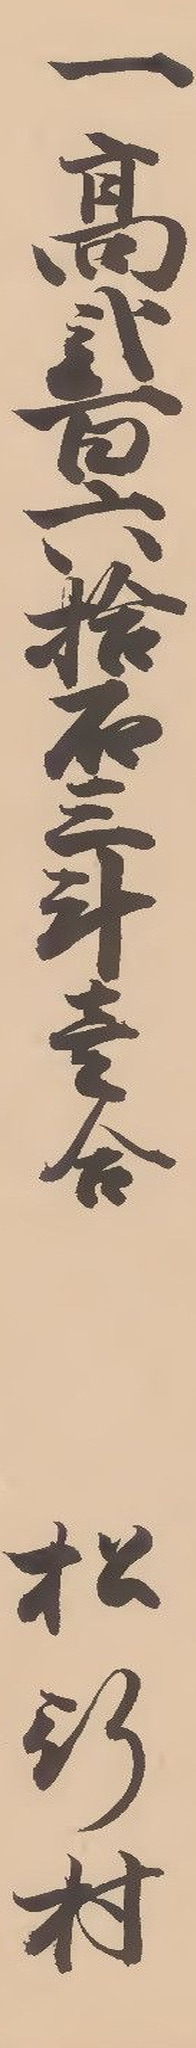一高弐百六拾石三斗壱合松行村
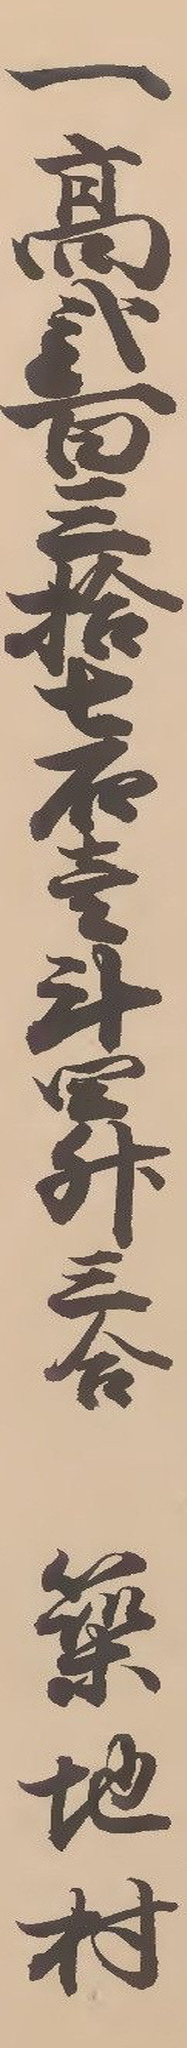一高弐百三拾七石壱斗四升三合築地村
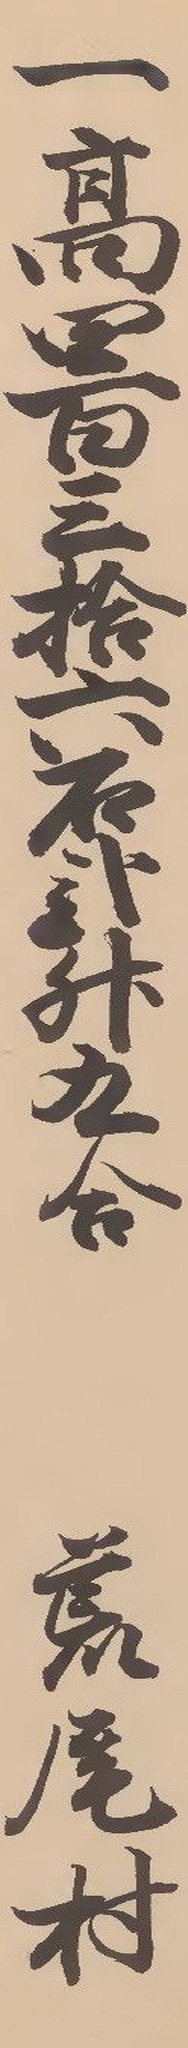一高四百三拾六石弐升九合荒尾村
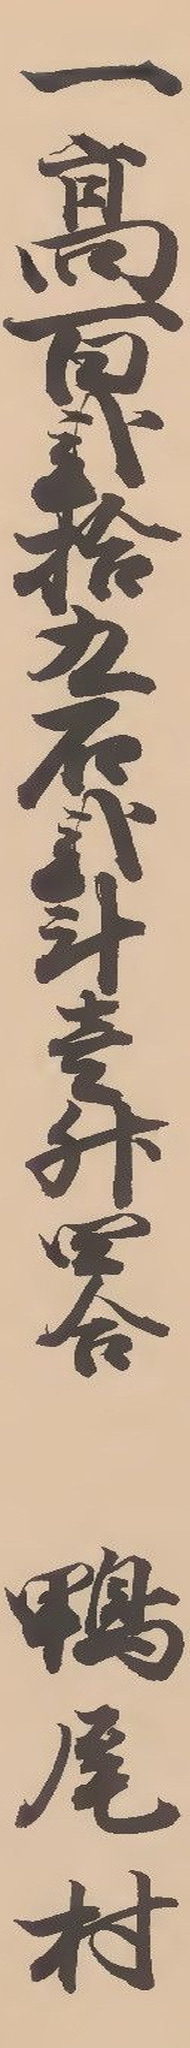一高百弐拾九石弐斗壱升四合鴨尾村
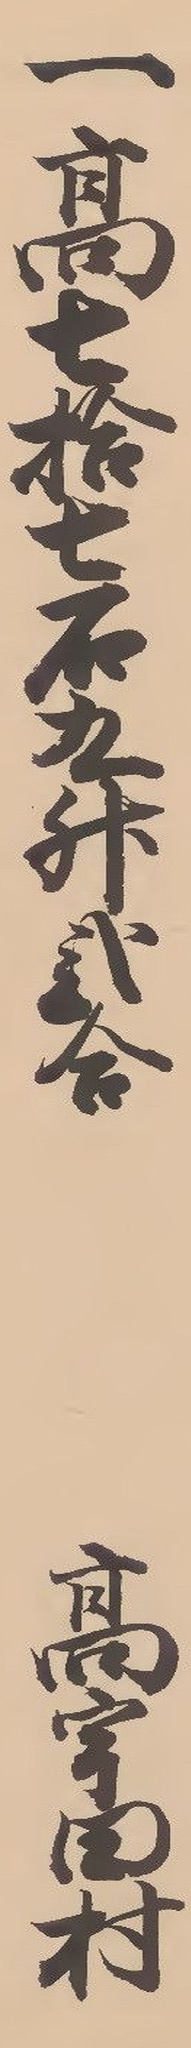一高七拾七石九升弐合高宇田村

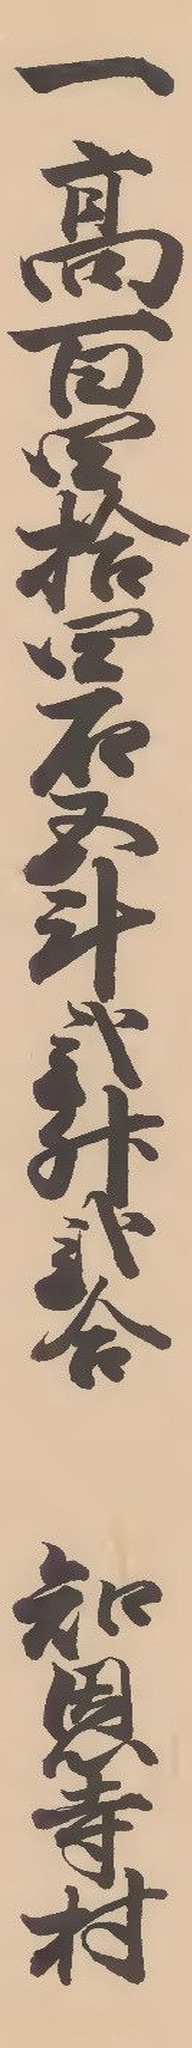一高百四拾四石五斗弐升弐合知恩寺村
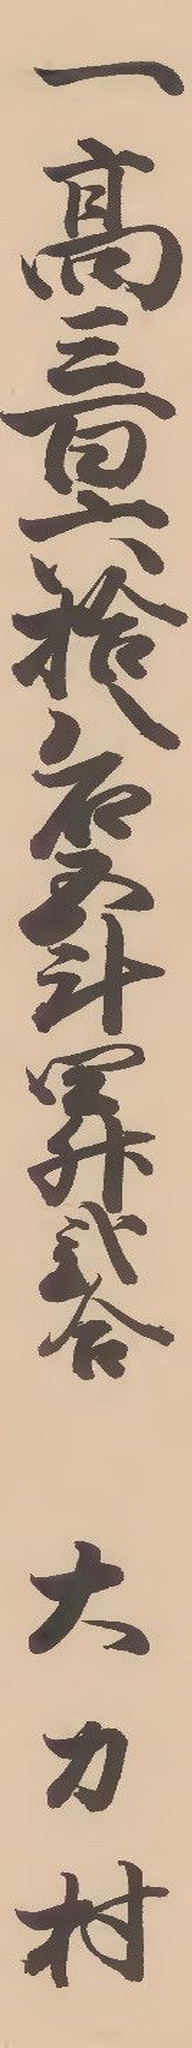一高三百六拾八石五斗四升弐合大力村
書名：豊後国郷帳
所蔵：国立公文書館 National Archives of Japan
